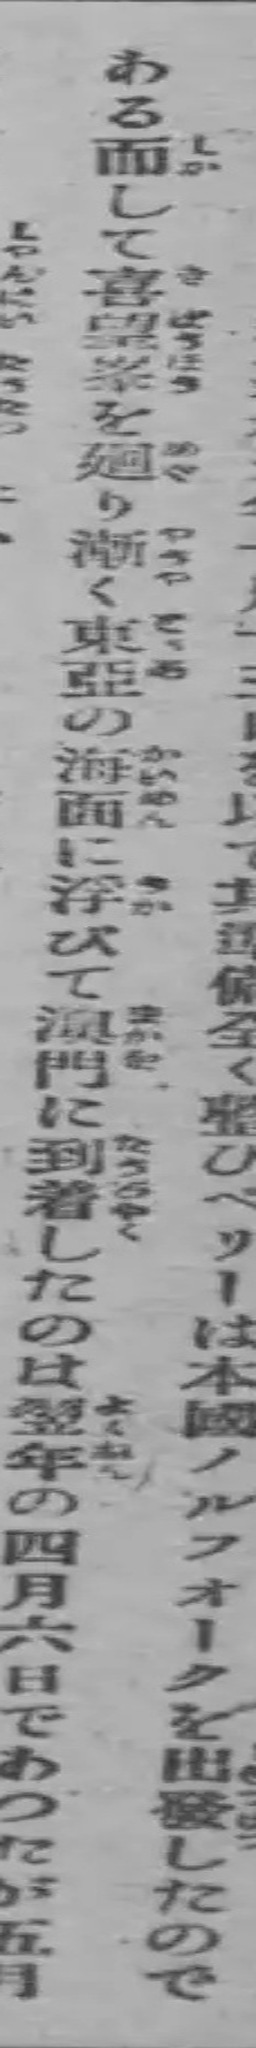ある而して喜望峯を廻り漸く東亜の海面に浮びて澳門に到着したのは翌年の四月六日であつたが五月
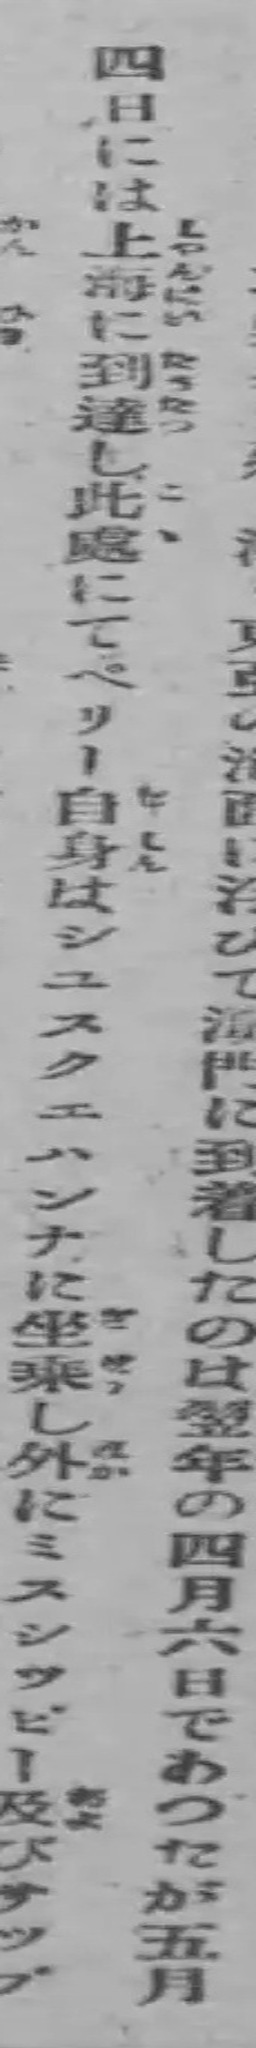四日には上海に到達し此処にてペリー自身はシユスクエハンナに坐乗し外にミスシツピー及びサツブ
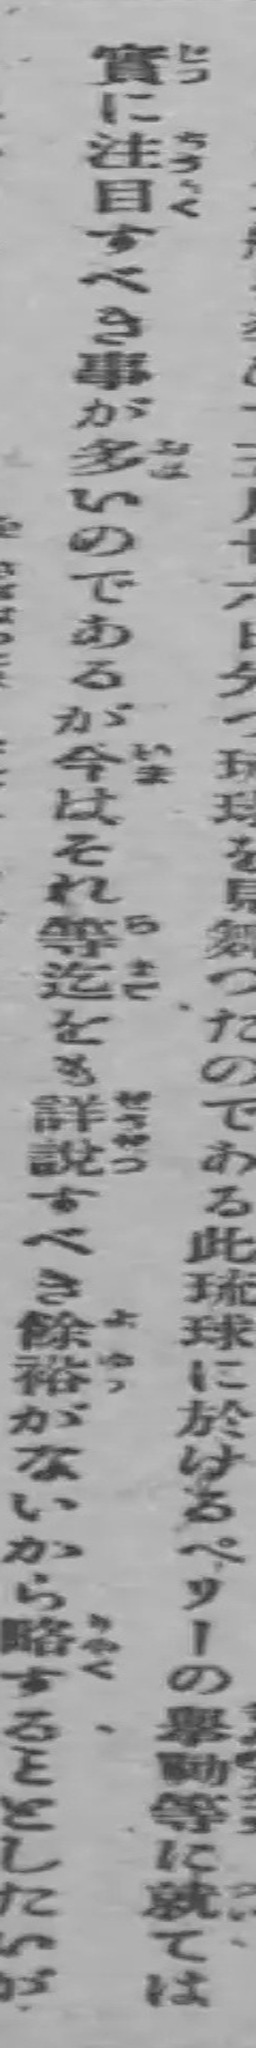実に注目すべき事が多いのであるが今はそれ等迄をも詳説すべき余裕がないから略することとしたいが
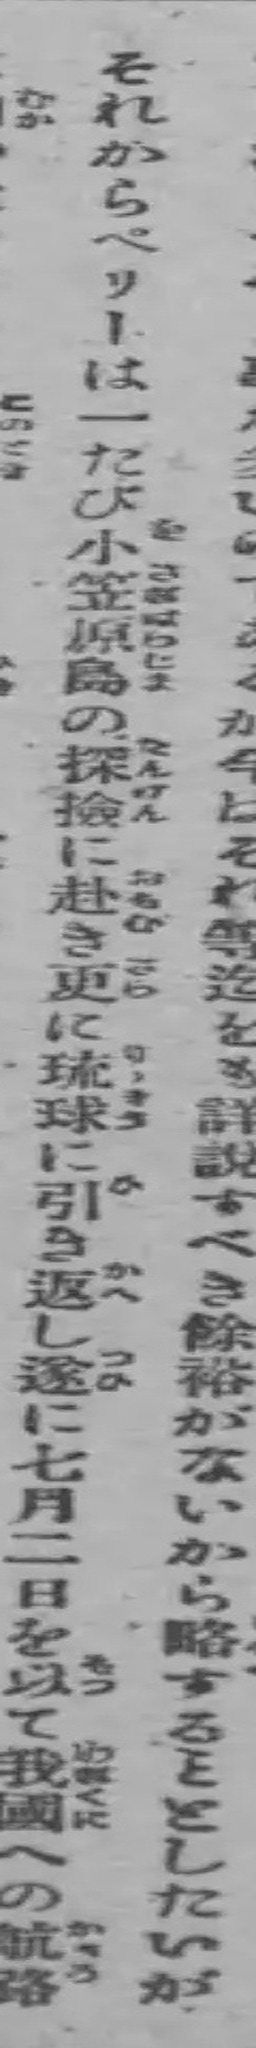それからペリーは一たび小笠原島の探検に赴き更に琉球に引き返し遂に七月二日を以て我国への航路
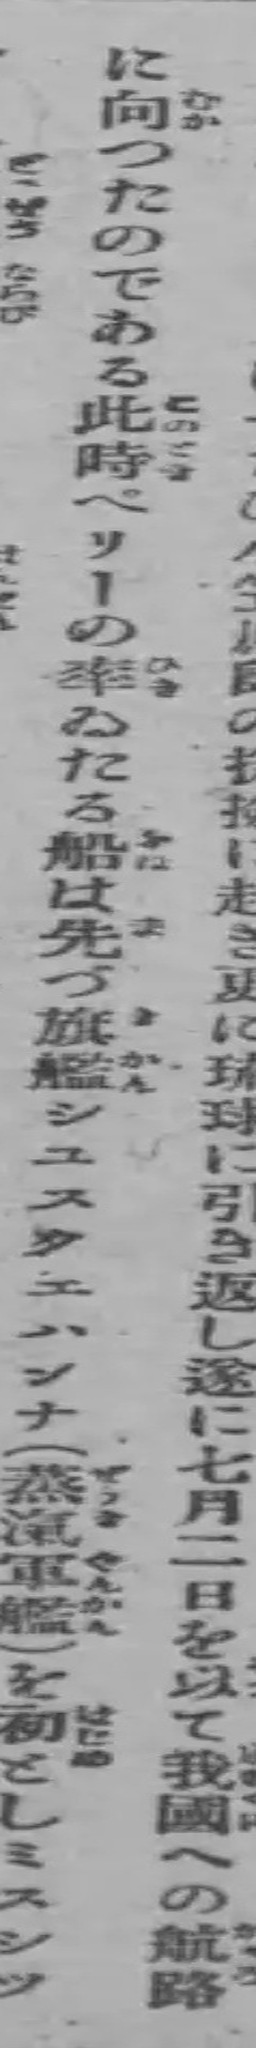に向つたのである此時ペリーの率ゐたる船は先づ旗艦シユスクエハンナ(蒸滊軍艦)を初としミスシツ
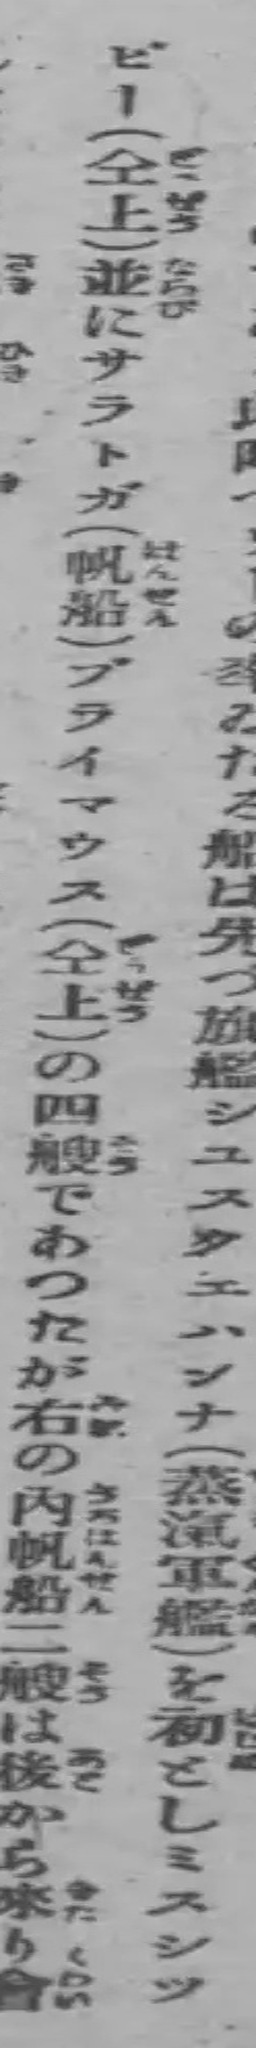ピー(仝上)並にサラトガ(帆船)ブライマウス(仝上)の四艘であつたが右の内帆船二艘は後から来り会
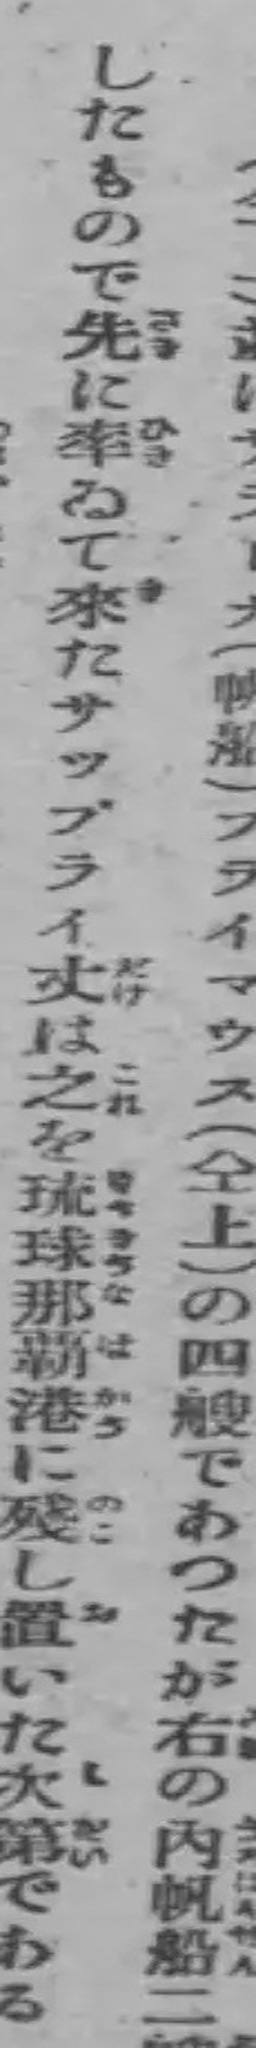したもので先に率ゐて来たサツブライ丈は之を琉球那覇港に残し置いた次第である
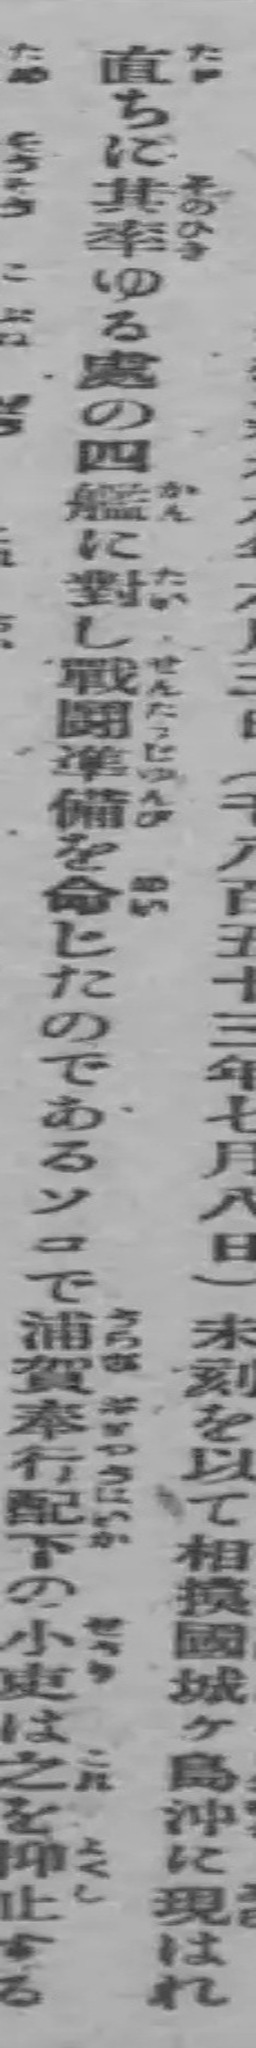直ちに其率ゆる処の四艦に対し戦闘準備を命じたのであるソコで浦賀奉行配下の小吏は之を抑止する
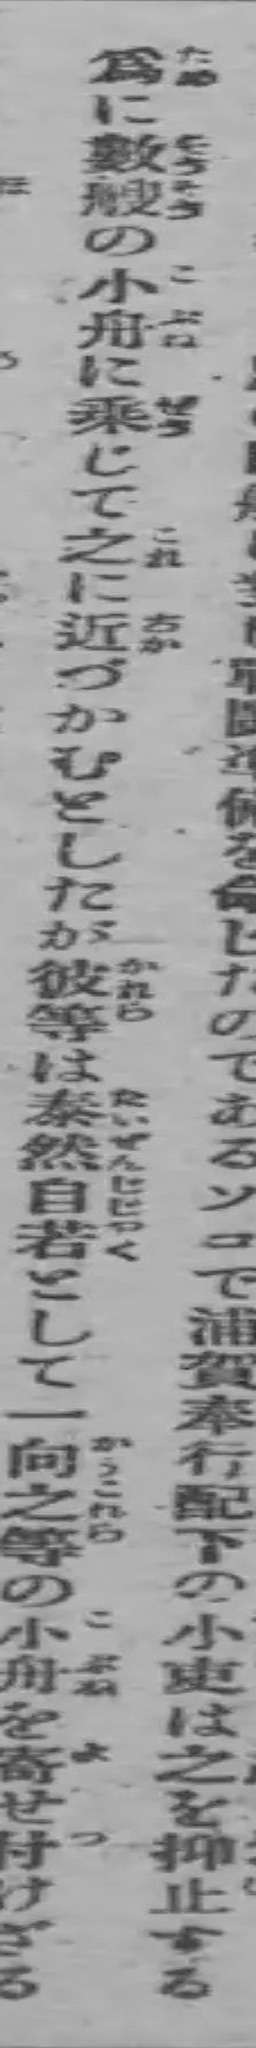為に数艘の小舟に乗じて之に近づかむとしたが彼等は泰然自若として一向之等の小舟を寄せ付けざる
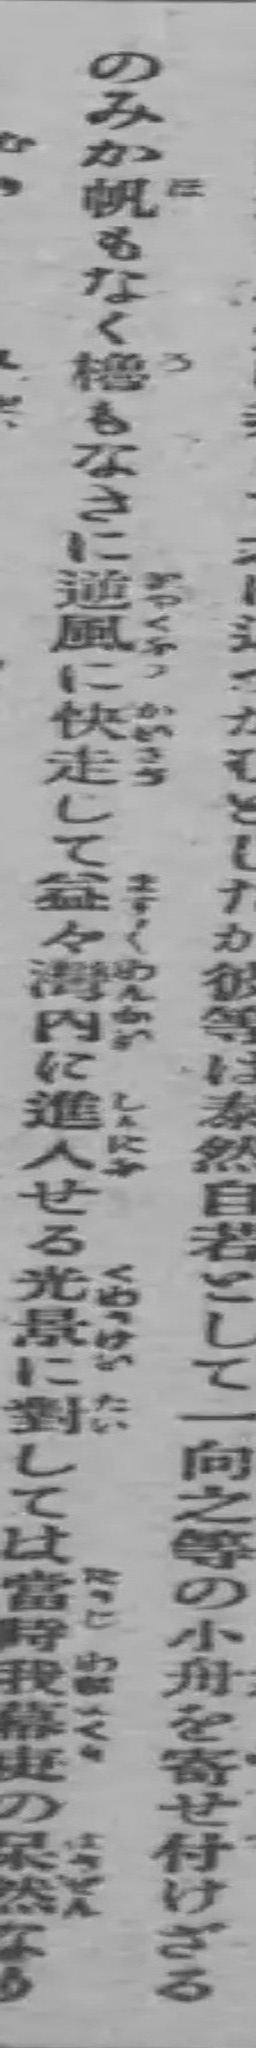のみか帆もなく櫓もなきに逆風に快走して益々湾内に進入せる光景に対しては当時我幕吏の呆然なり
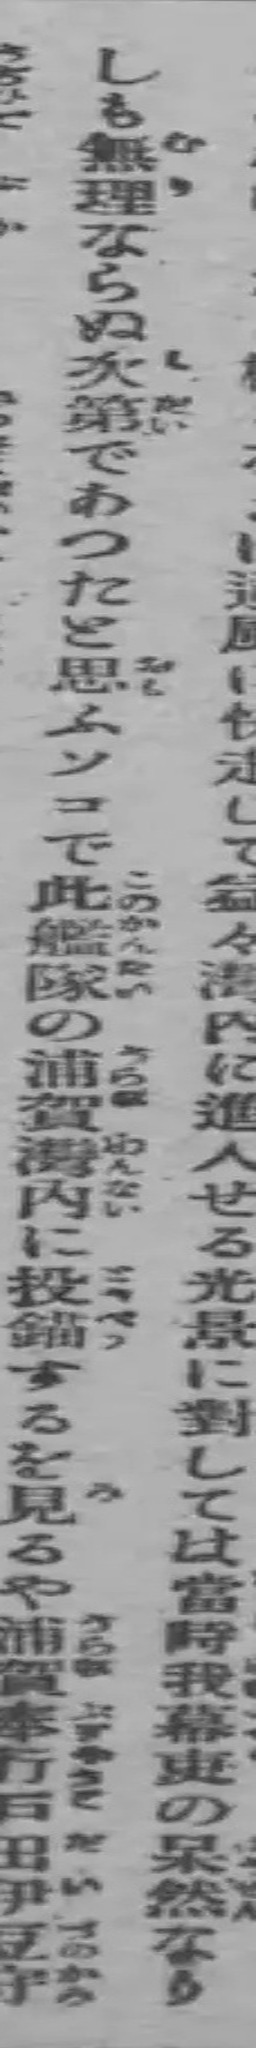しも無理ならぬ次第であつたと思ふソコで此艦隊の浦賀湾内に投錨するを見るや浦賀奉行戸田伊豆守
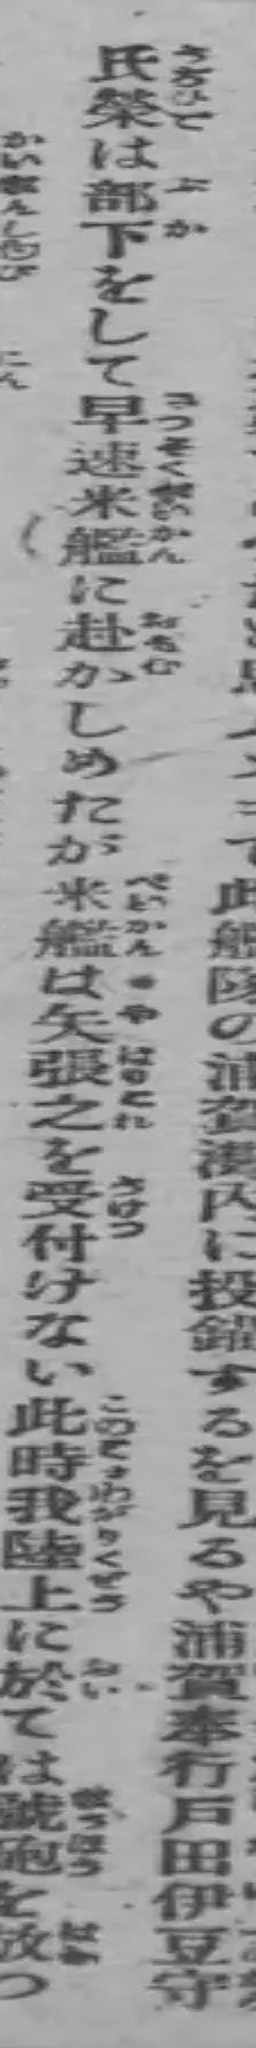氏栄は部下をして早速米艦に赴かしめたが米艦は矢張之を受付けない此時我陸上に於ては号砲を放つ
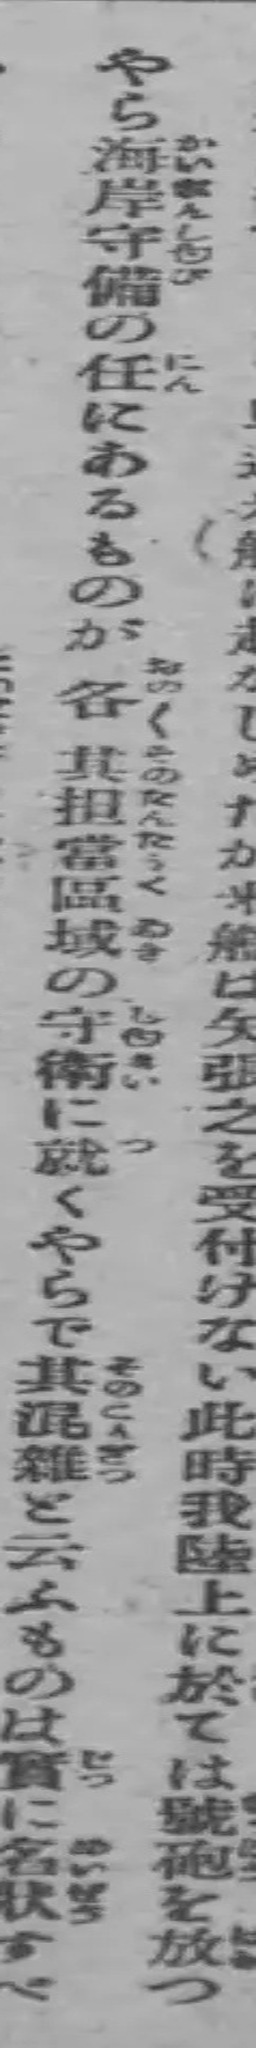やら海岸守備の任にあるものが各其担当区域の守衛に就くやらで其混雑と云ふものは実に名状すべ
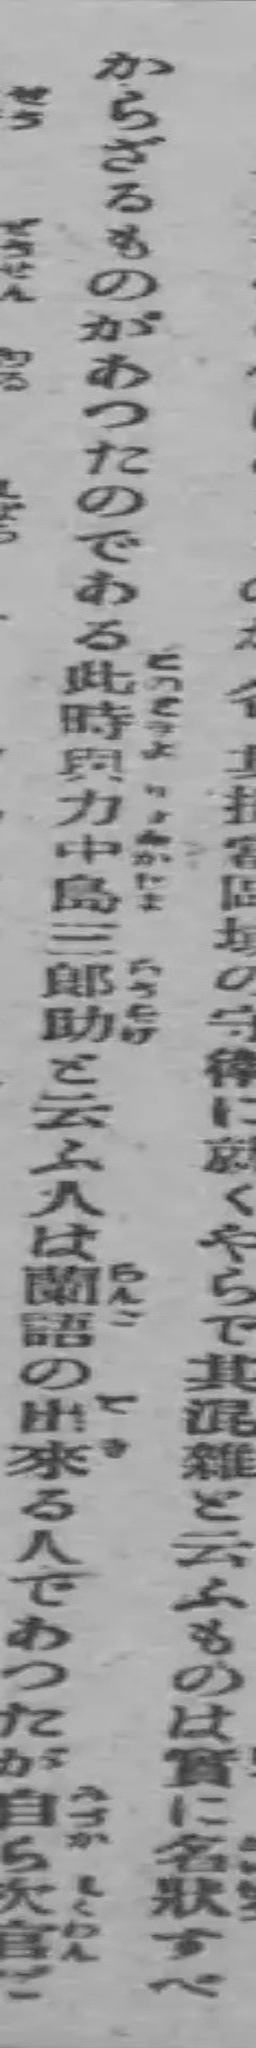からざるものがあつたのである此時与力中島三郎助と云ふ人は蘭語の出来る人であつたが自ら次官だ
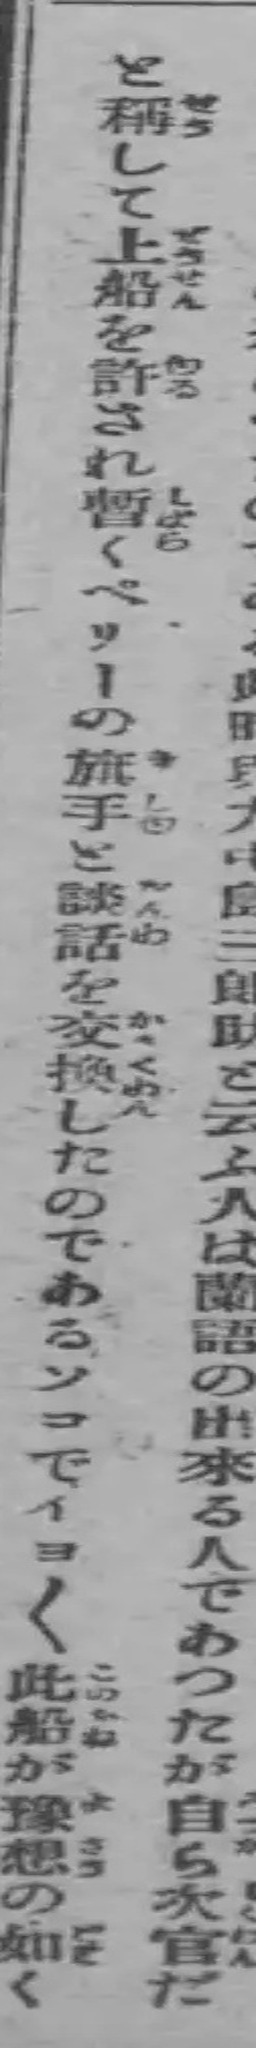と称して上船を許され暫くペリーの旗手と談話を交換したのであるソコでイヨ〳〵此船が予想の如く
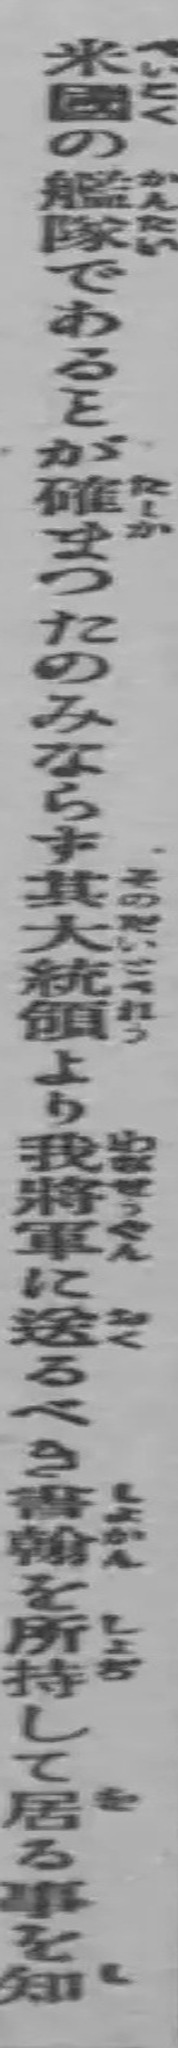米国の艦隊であることが確まつたのみならず其大統領より我将軍に送るべき書翰を所持して居る事を知
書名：豊橋市史談
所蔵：国立国会図書館 National Diet Library, JAPAN
